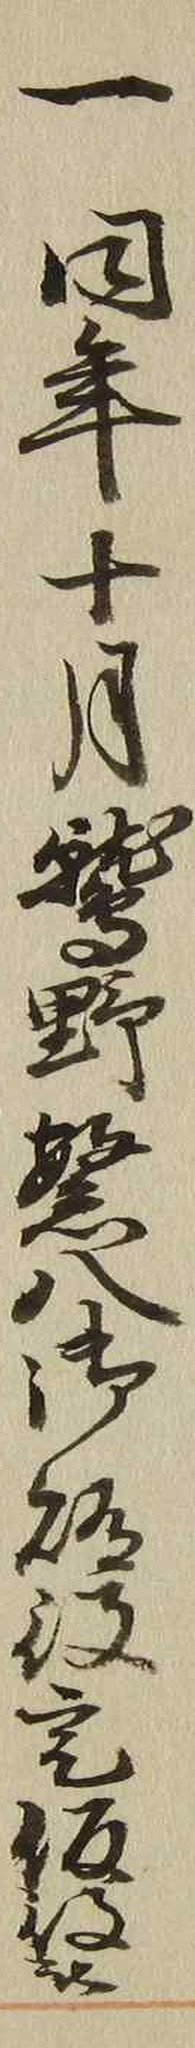一同年十月鷲野繁八御賄役定仮役被
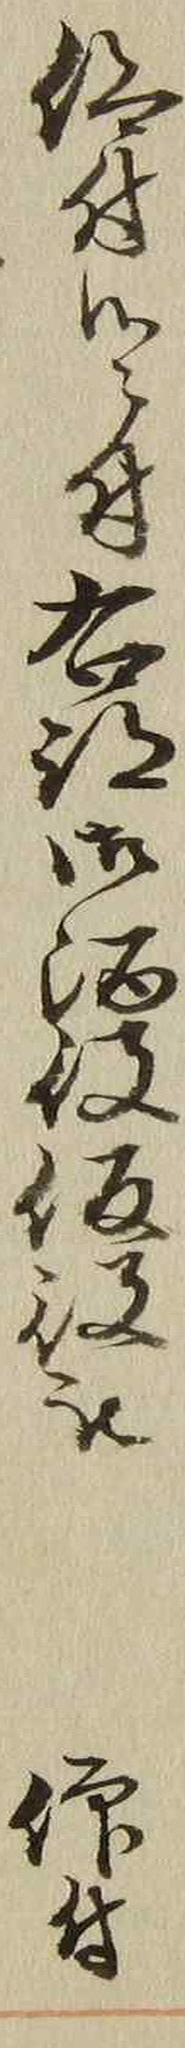仰付候ニ付右跡御酒役仮役被仰付
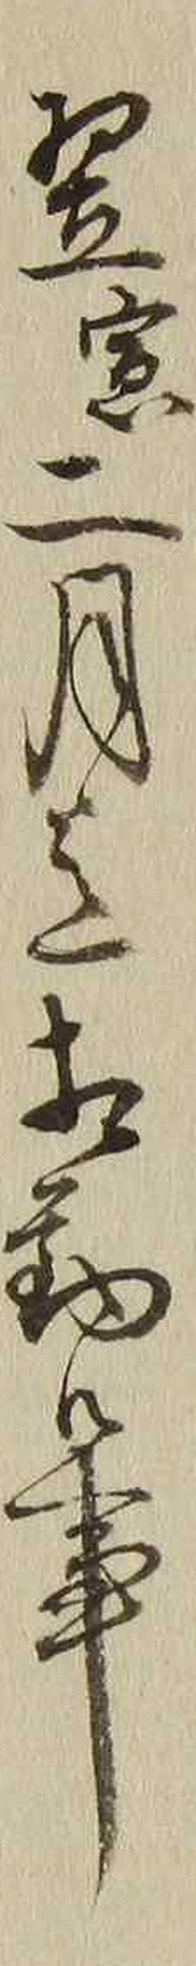翌寅二月迄相勤候事
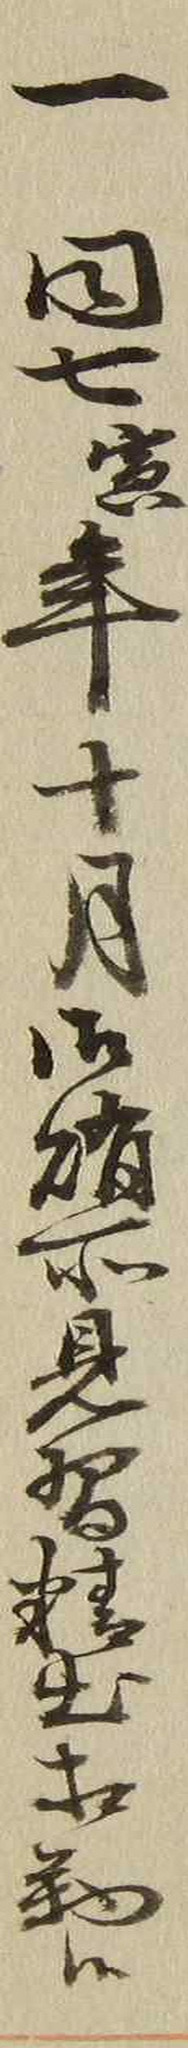一同七寅年十月御賄所見習精出相勤候
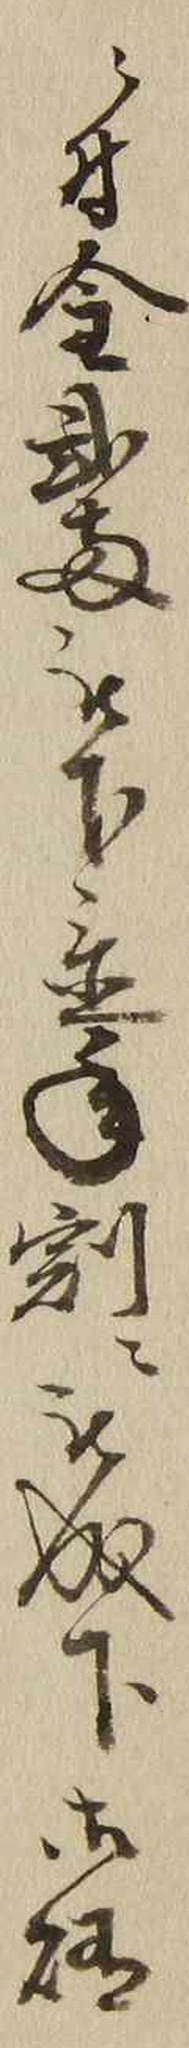ニ付金弐両被下置年割ニ成下御賄
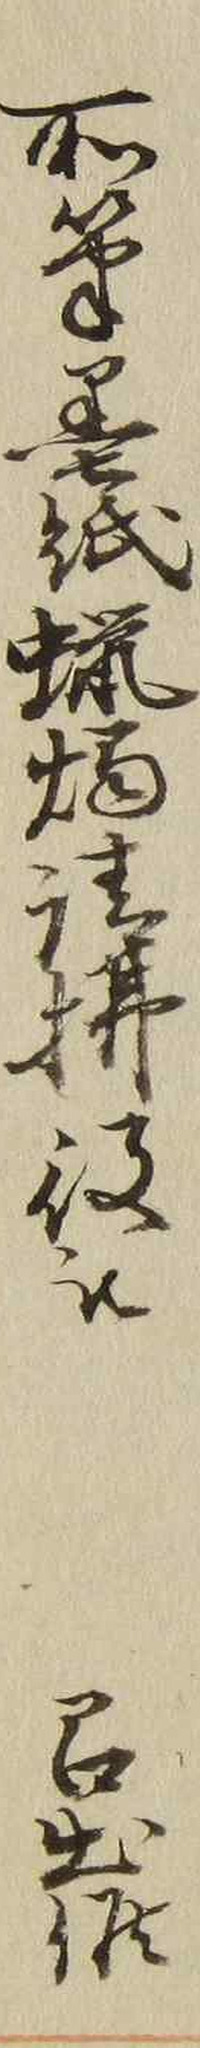所筆墨紙蠟燭請拂役被召出候

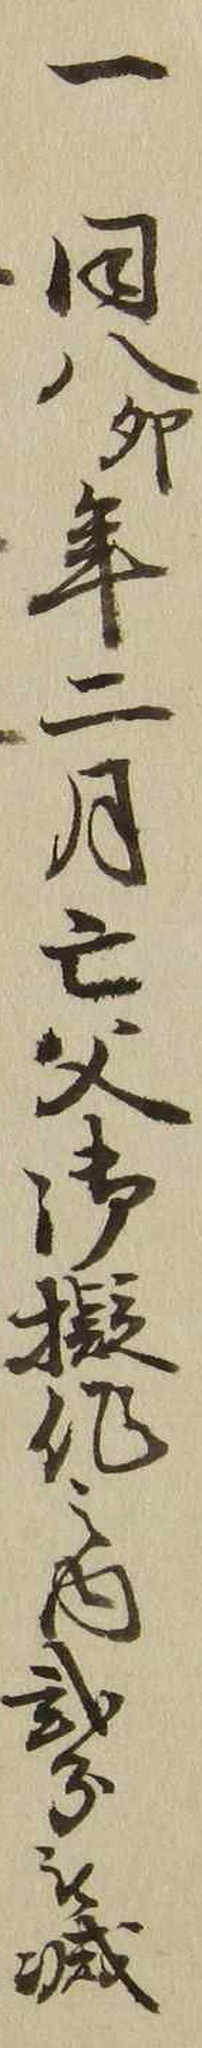一同八卯年二月亡父御宛擬作之内弐分被減
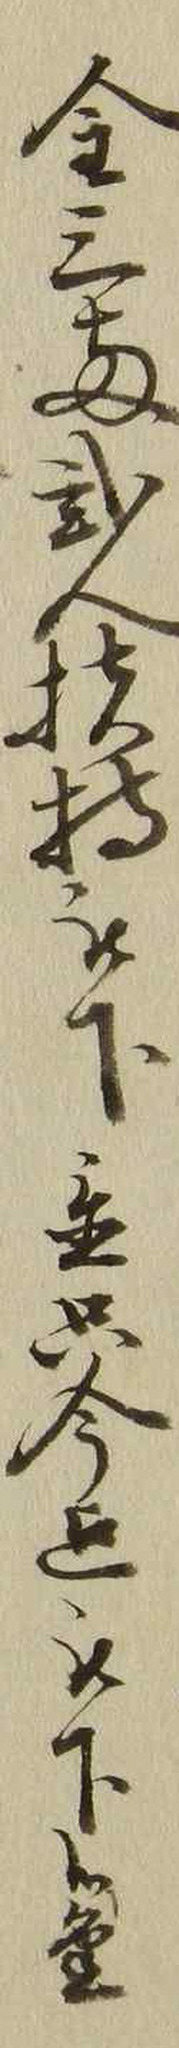欽三両弐人扶持被下置只今迄被下候金
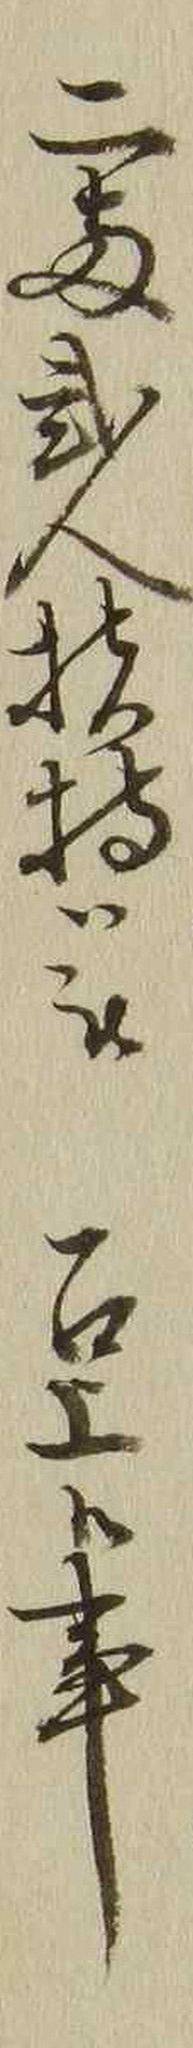二両弐人扶持ハ召上候事
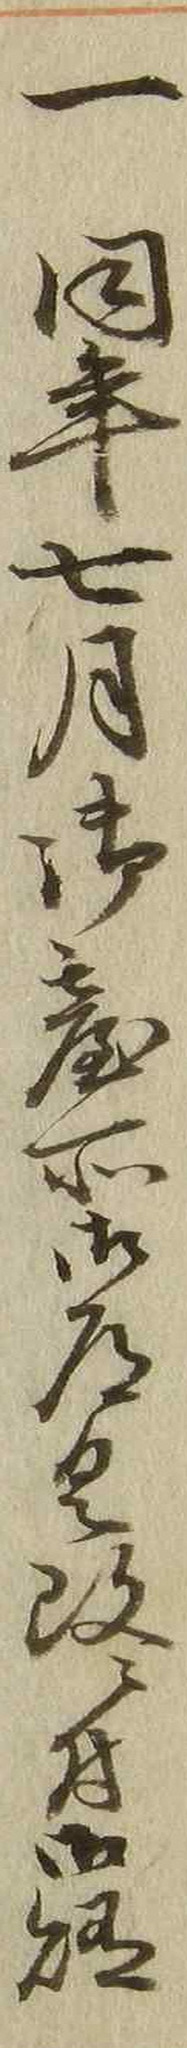一同年七月御台所御道具改ニ付御賄
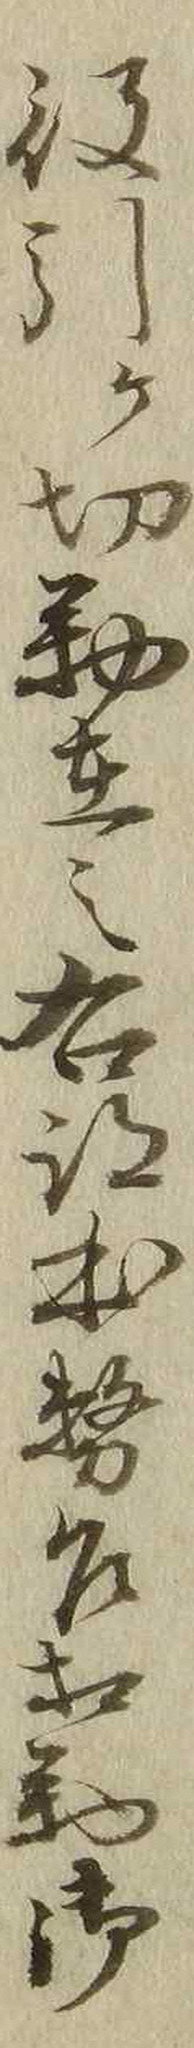役引ケ切勤在之右跡本務乍相勤御
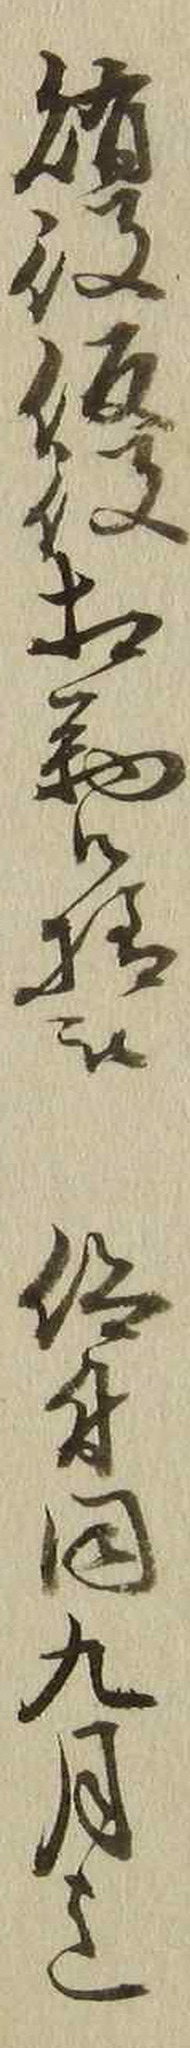賄役仮役相勤候様被仰付同九月迄
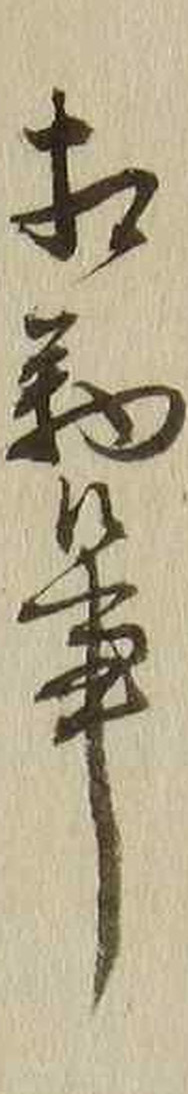相勤候事
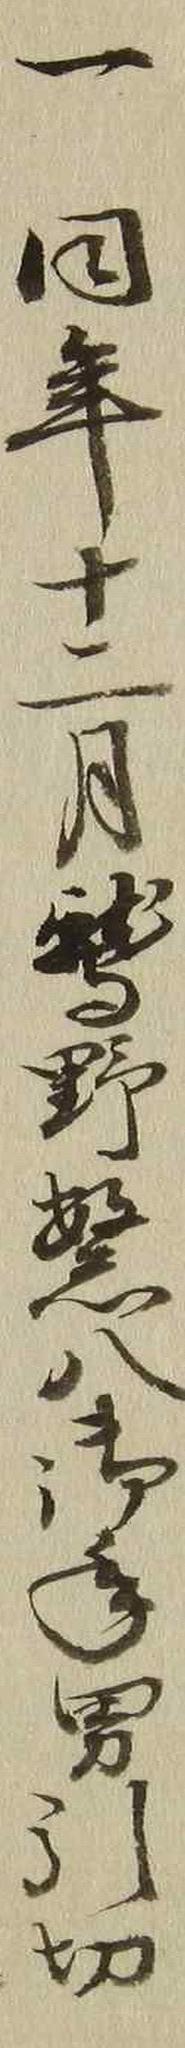一同年十二月鷲野繫八御手男引切
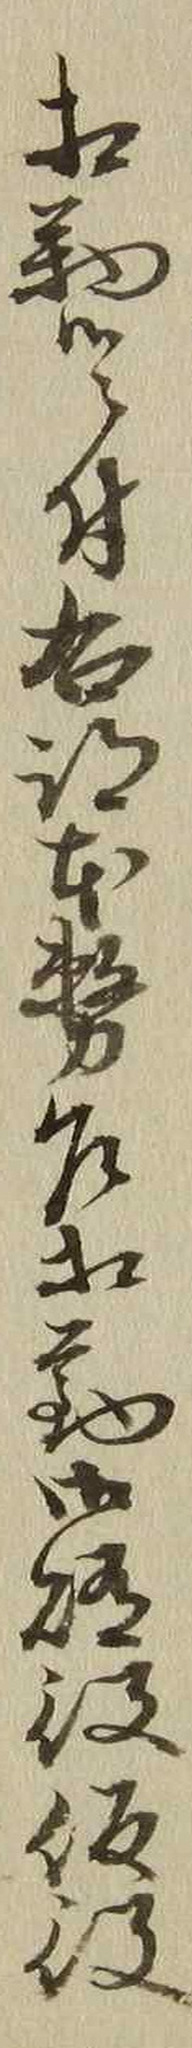相勤候ニ付右跡本務乍相勤御賄役仮役
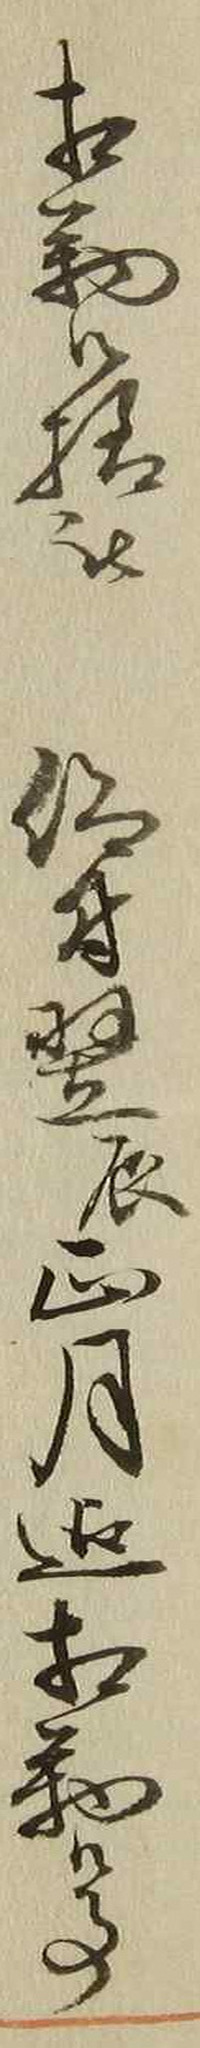相勤候様被仰付翌辰正月迄相勤候事
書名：諸士系譜　巻之64　と之部7
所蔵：会津若松市立会津図書館
